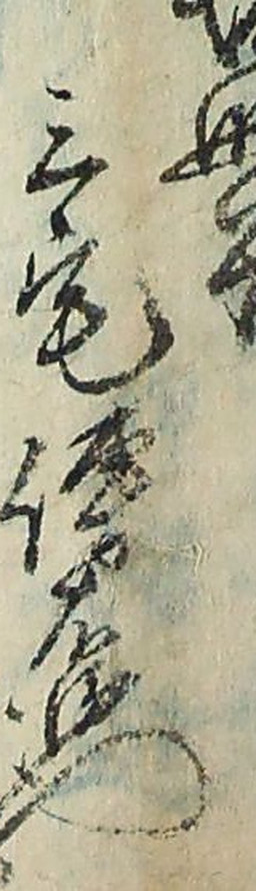三宅傳右衛門
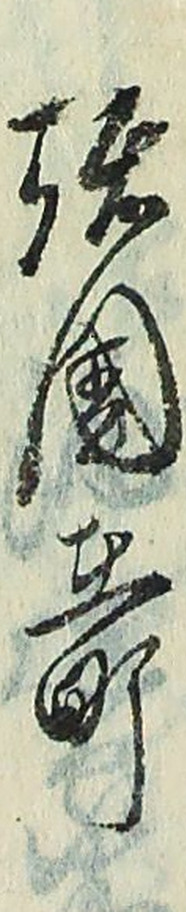諸國在町
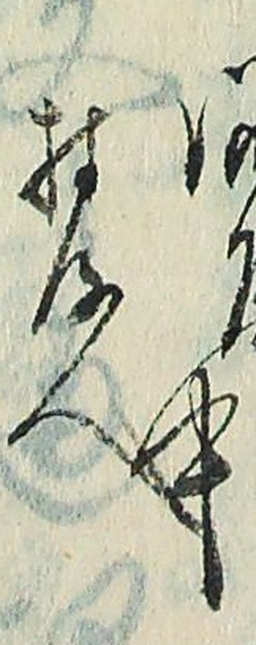村役人
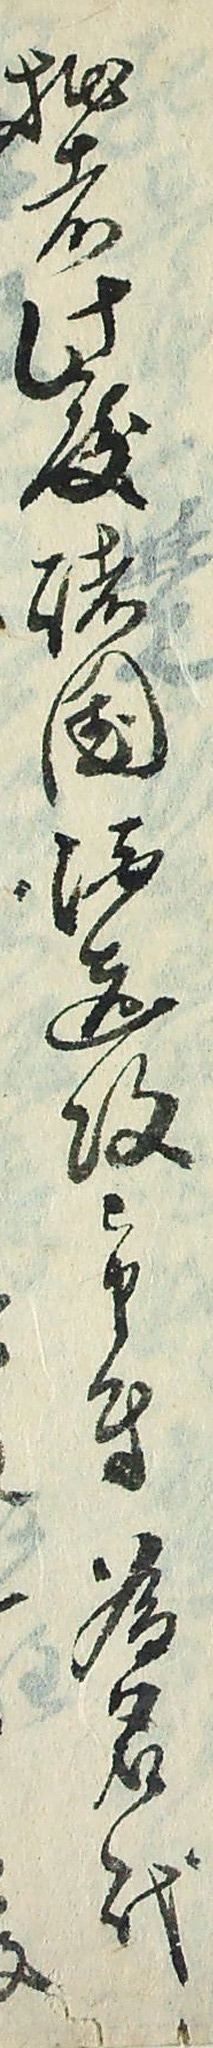拙者此度諸国酒造改被申付為名代
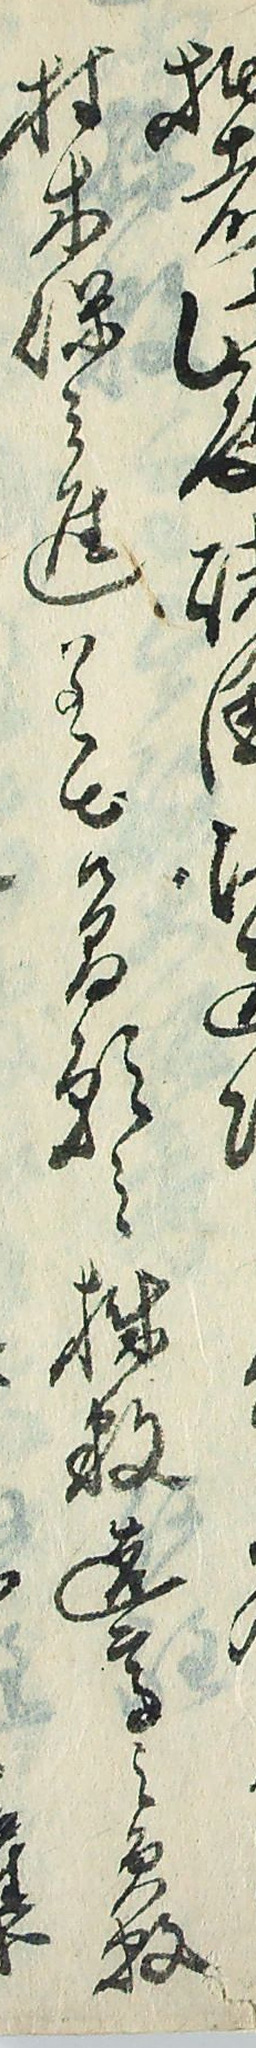村木保之進差出候間願之株数造高之員数

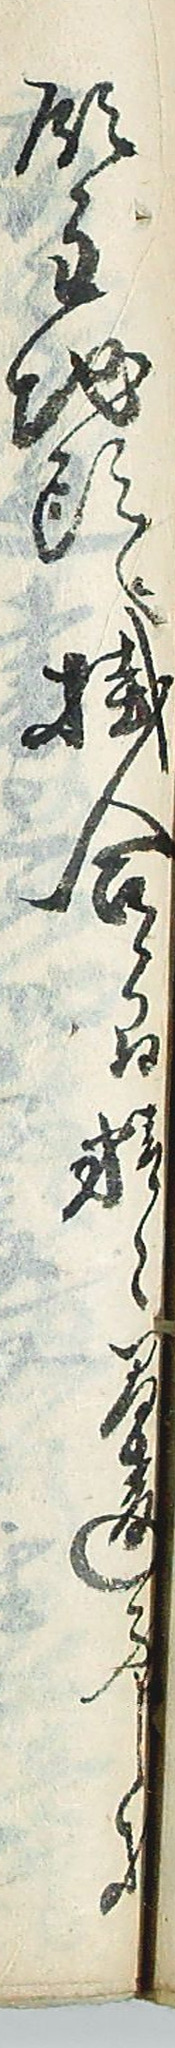領主地頭へ掛合候間精々間違不申様
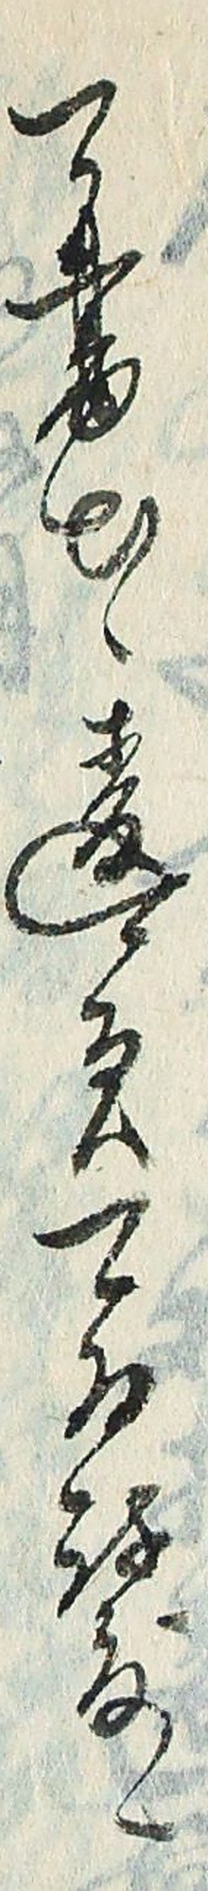可書出候違候而ハ可為越度候
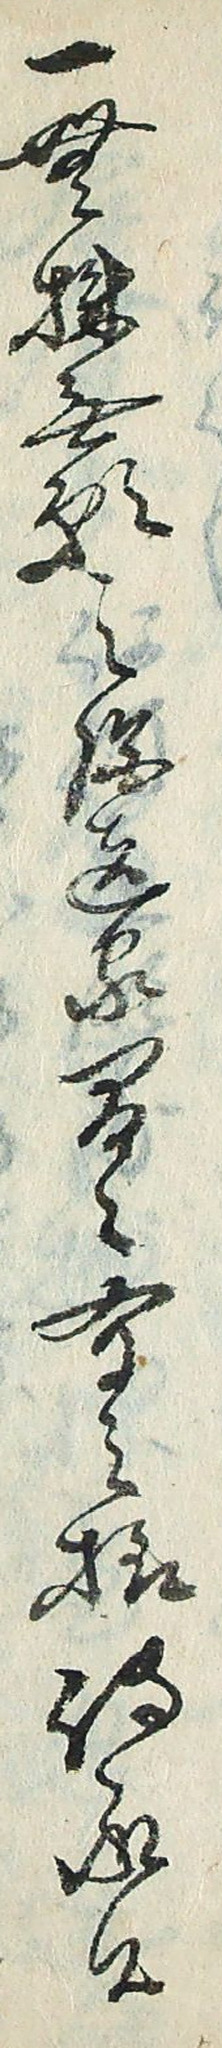一無株無願之酒造家間々有之様傳承候
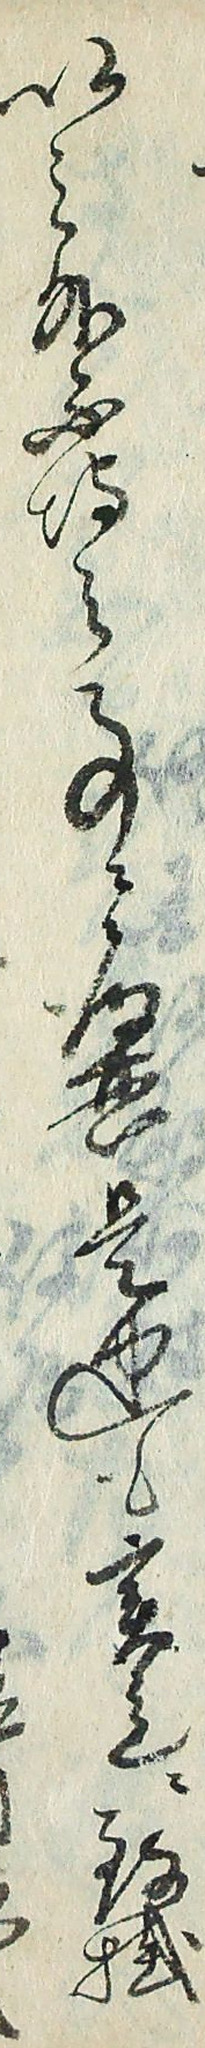以之外不埒之事ニ候得共是迚実意ニ致掛
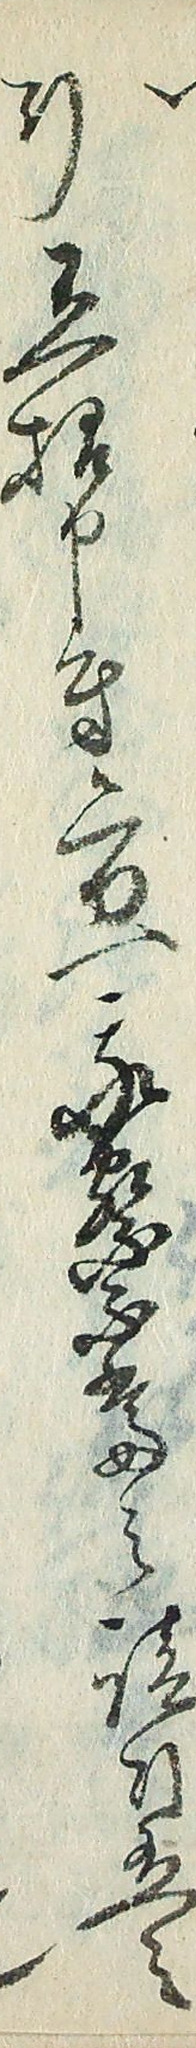引有様申付候万一我察不當之請引有之
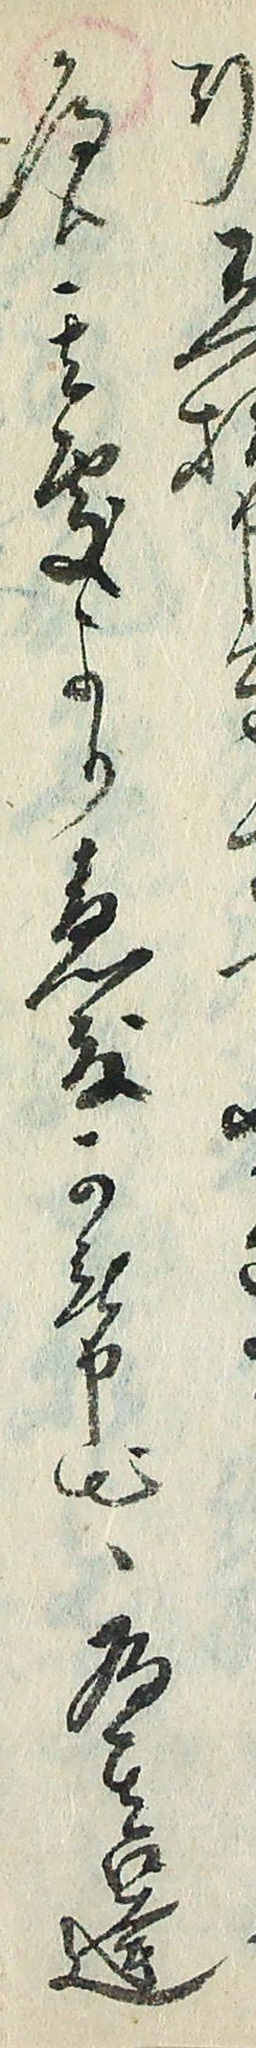候得ハ其處より急度可被申出候為其口達
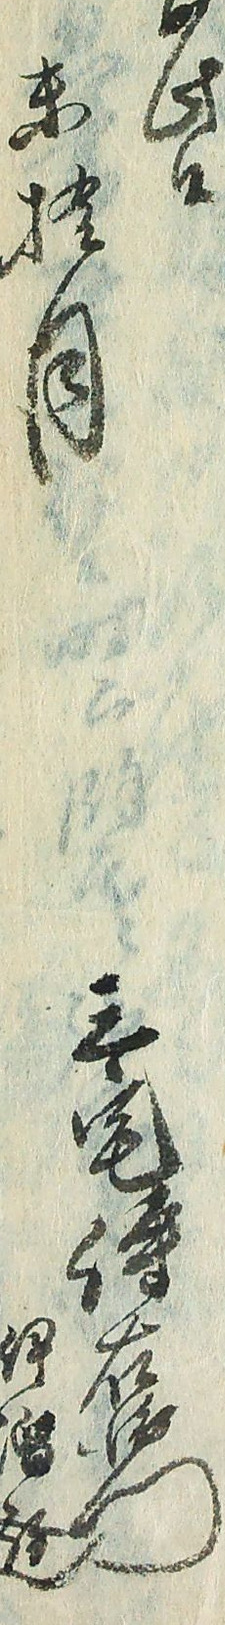未拾月三宅傳右衛門
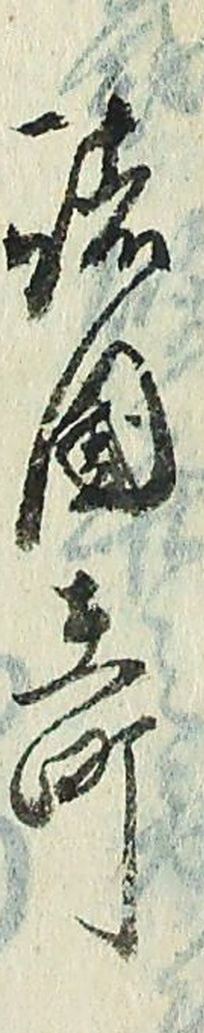諸國在町
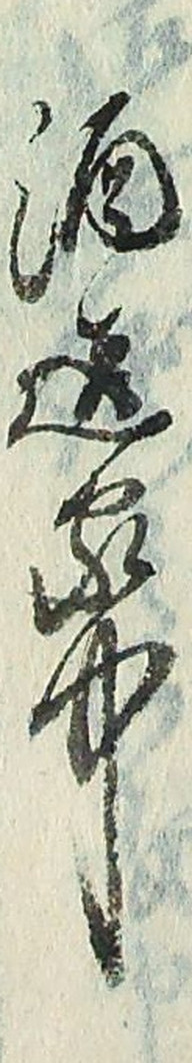酒造家中
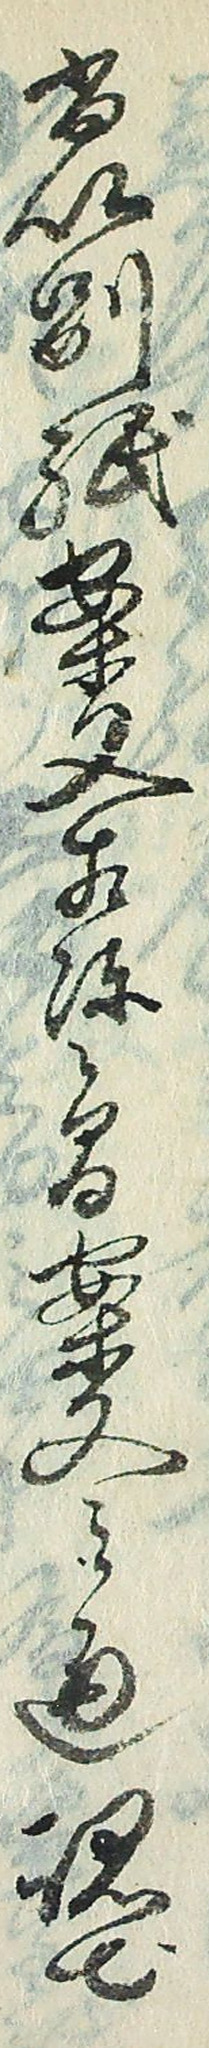尚以別紙案文相添候間案文之通認出
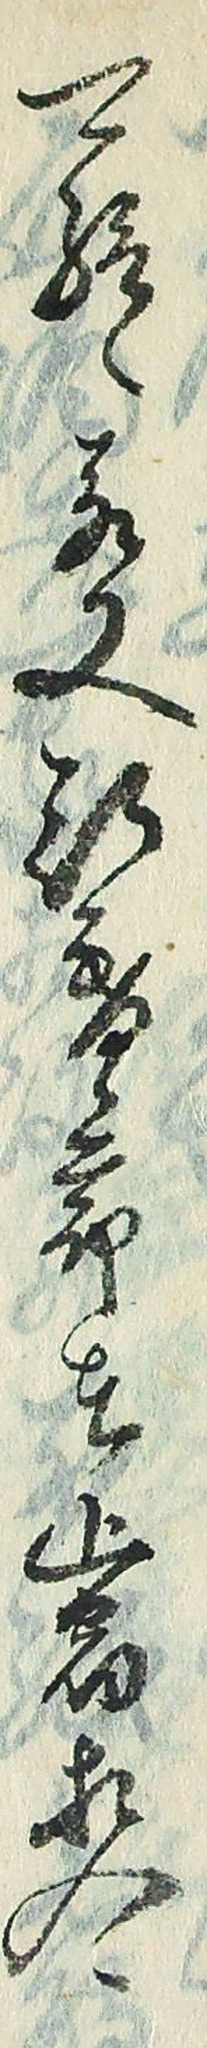可給候若又行暮候節者止宿相入候
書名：諸御趣意書并御下知向之写
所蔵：鳴門教育大学 Naruto University of Education
